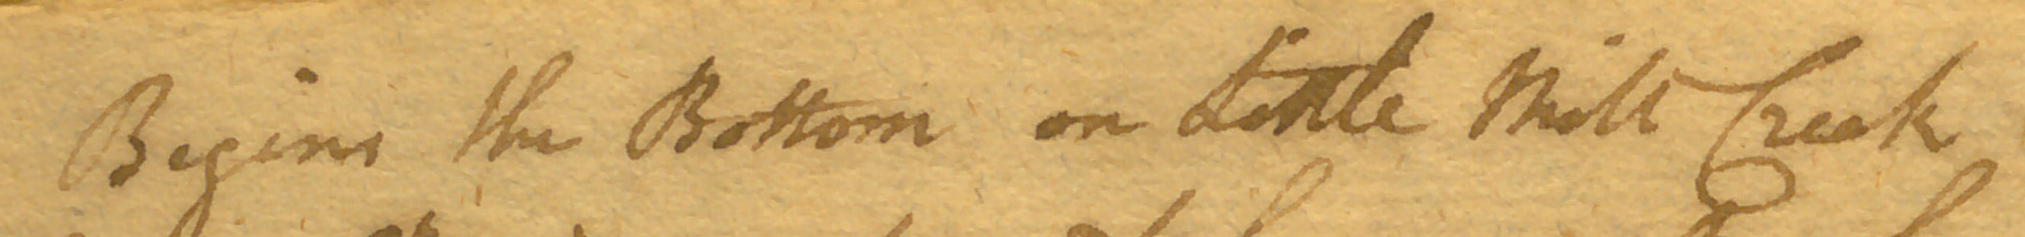Begins the Bottom on Little Mill Creak
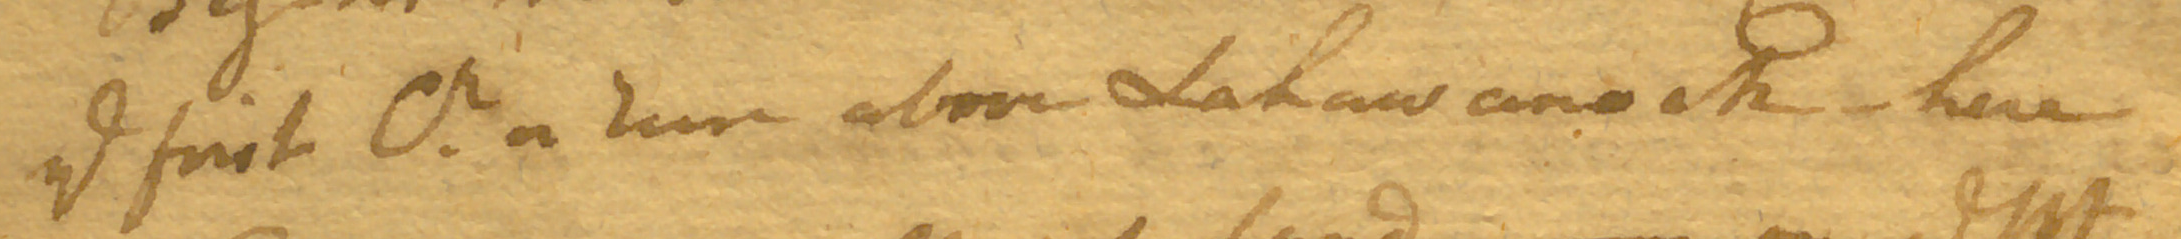y^e first C^r. a run above Lakawanock- here
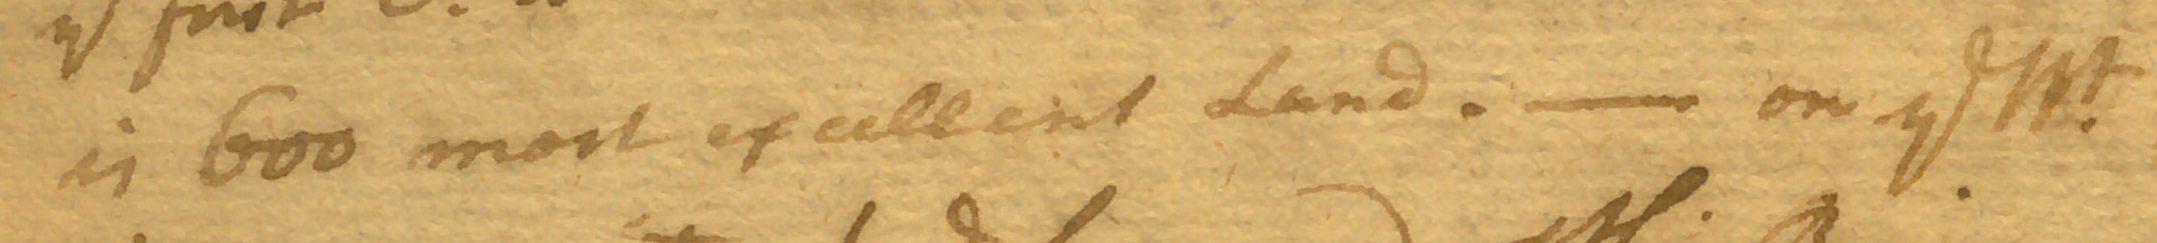is 600 most excellent Land.- on y^e W^t.
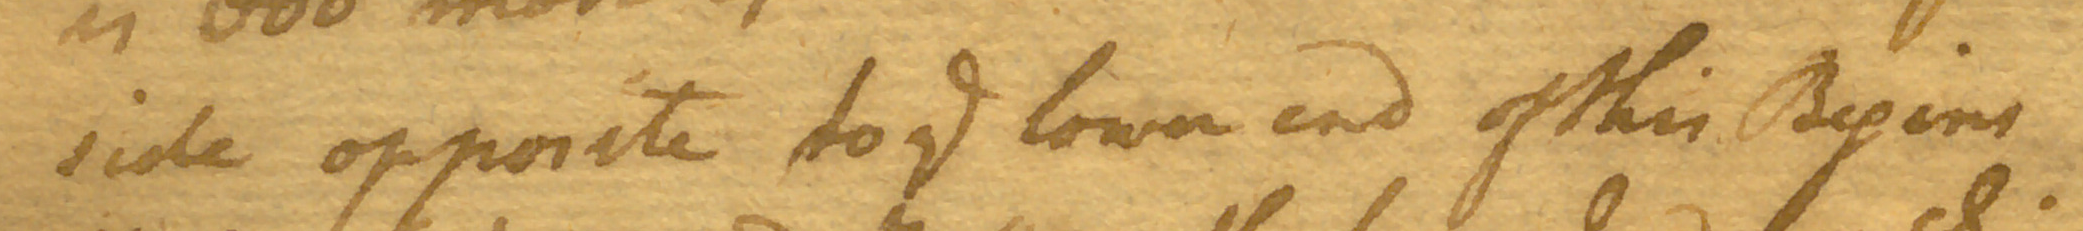side opposite to y^e lower end of this Begins
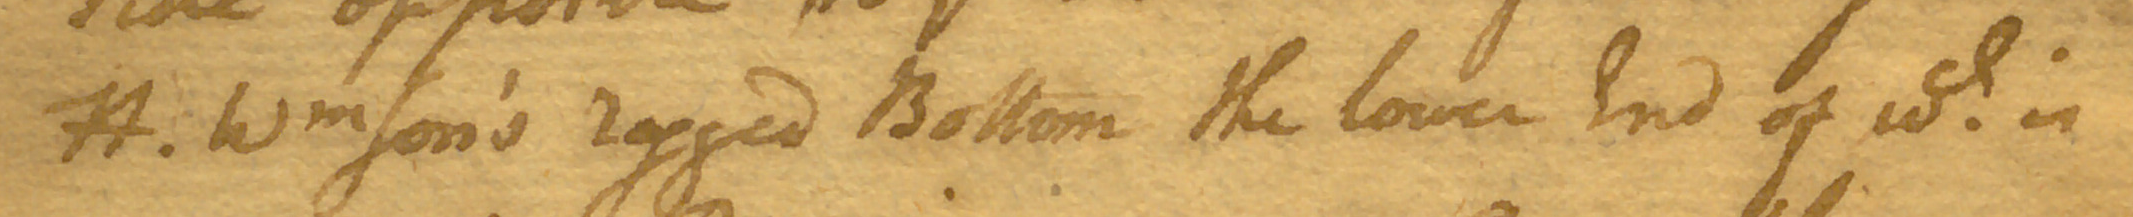H. W^mson's ragged Bottom the lower End of w^ch. is
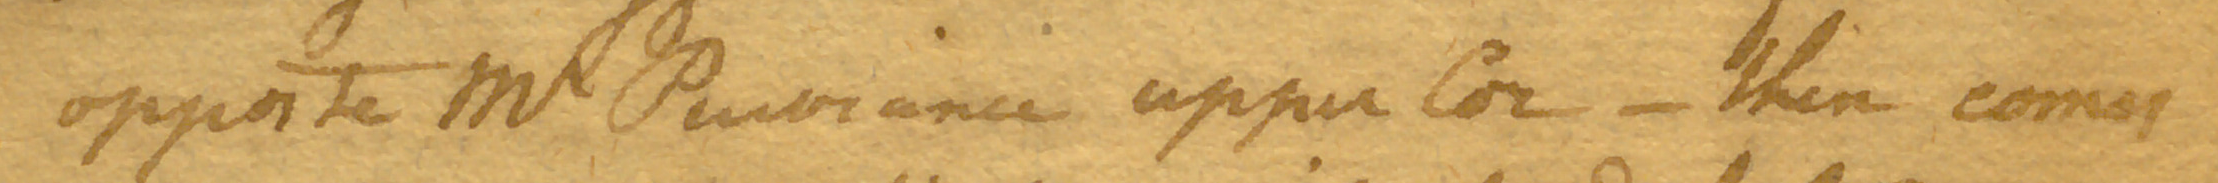opposite M^r Purviance upper Cor- then comes
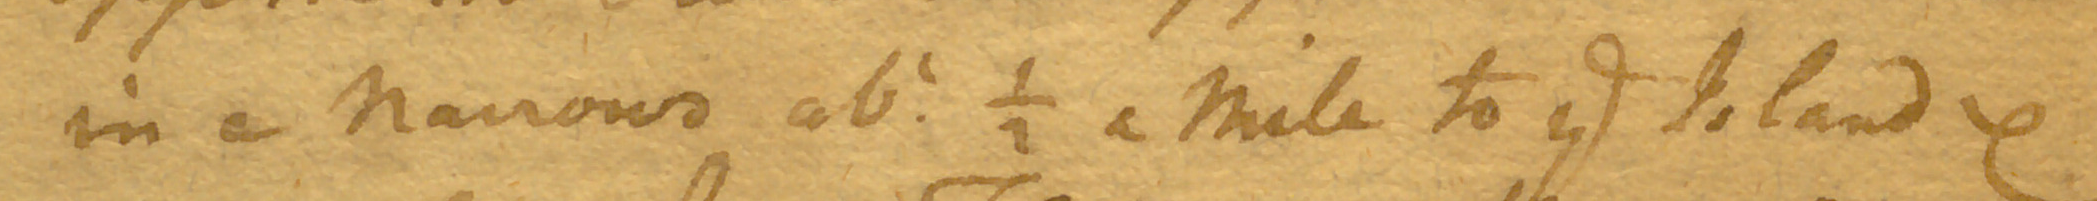in a Narrows ab^t. 1/2 a mile to y^e Island &
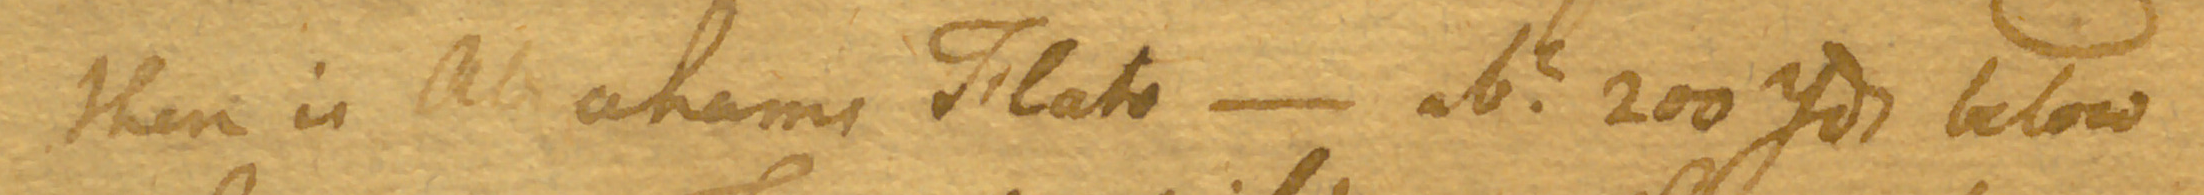then in Abrahams Flats- ab^t. 200 yds below
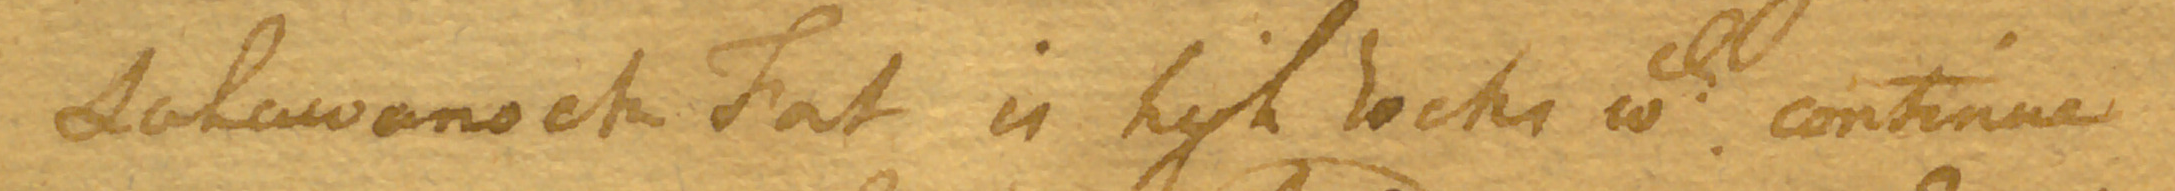Lahawanock Fort is high rocks w^ch continue
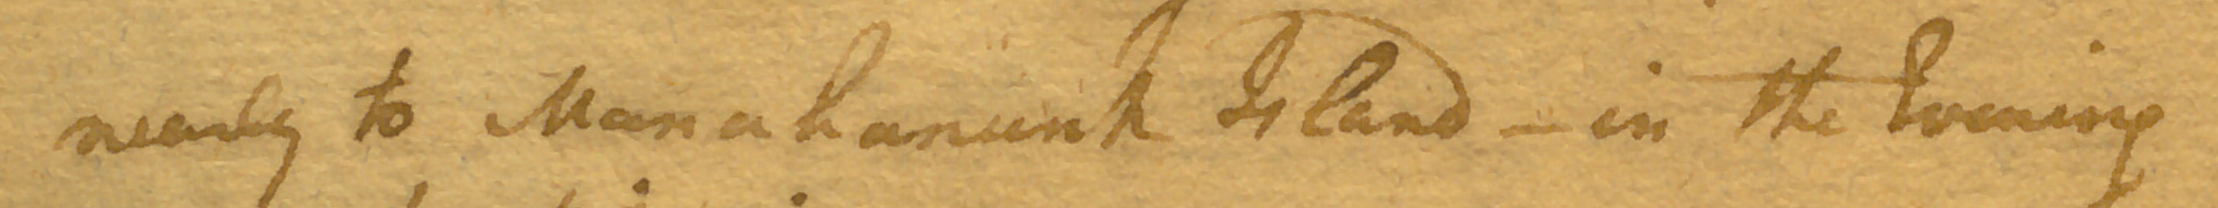nearly to Manahanunk Island- in the Evening
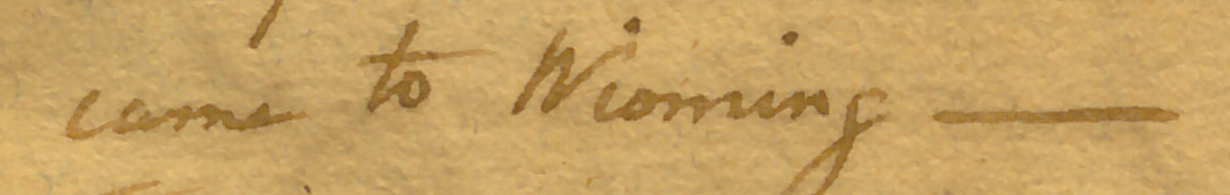came to Wioming-
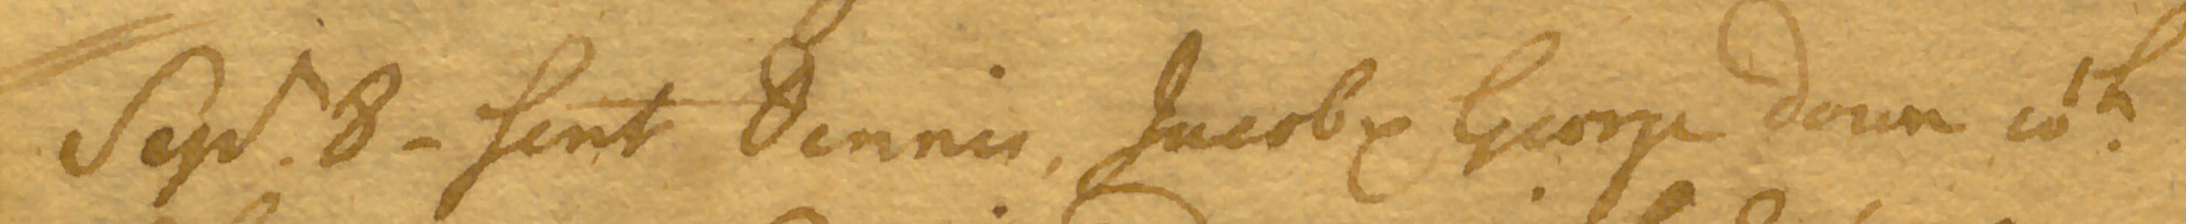Sep^r. 8- Sent Dennis, Jacob & George down w^th.
